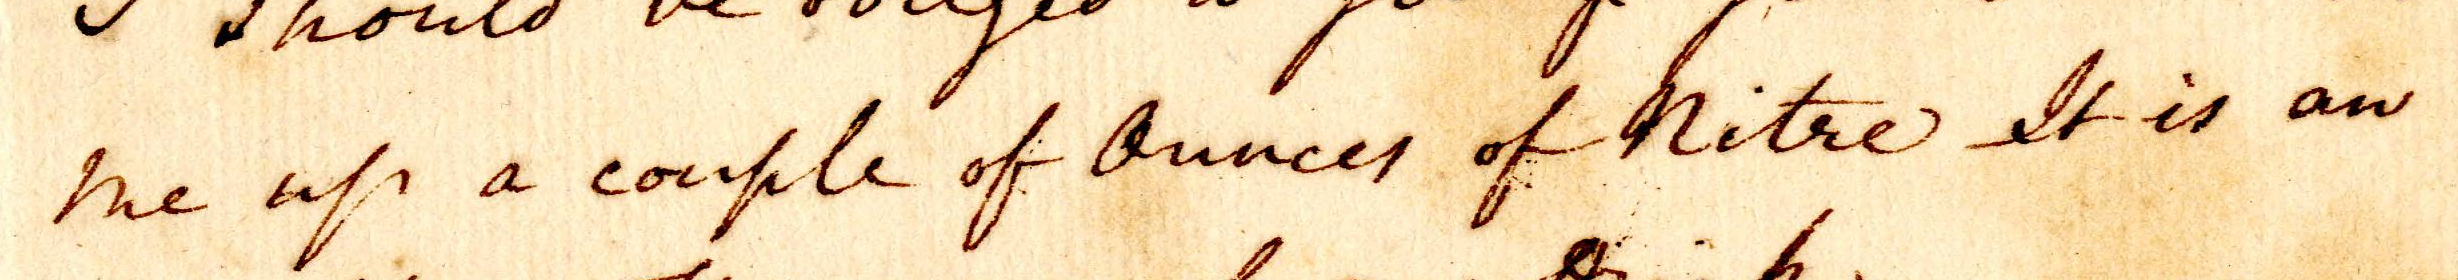me up a couple of Ounces of Nitre It is an
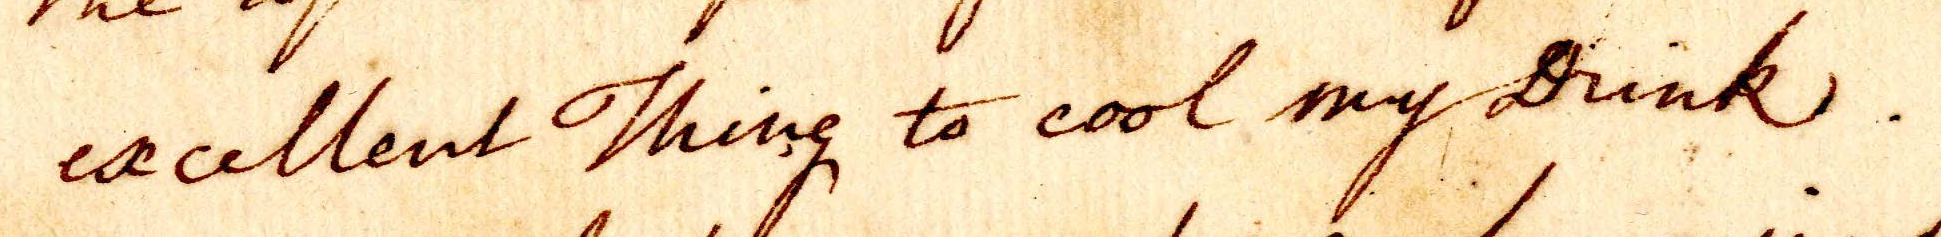excellent Thing to cool my Drink.
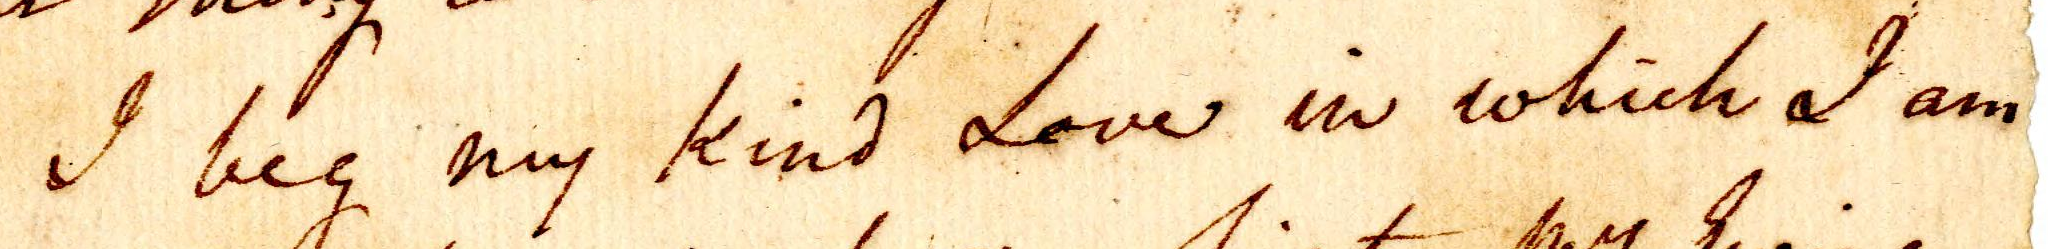I beg my kind Love in which I am
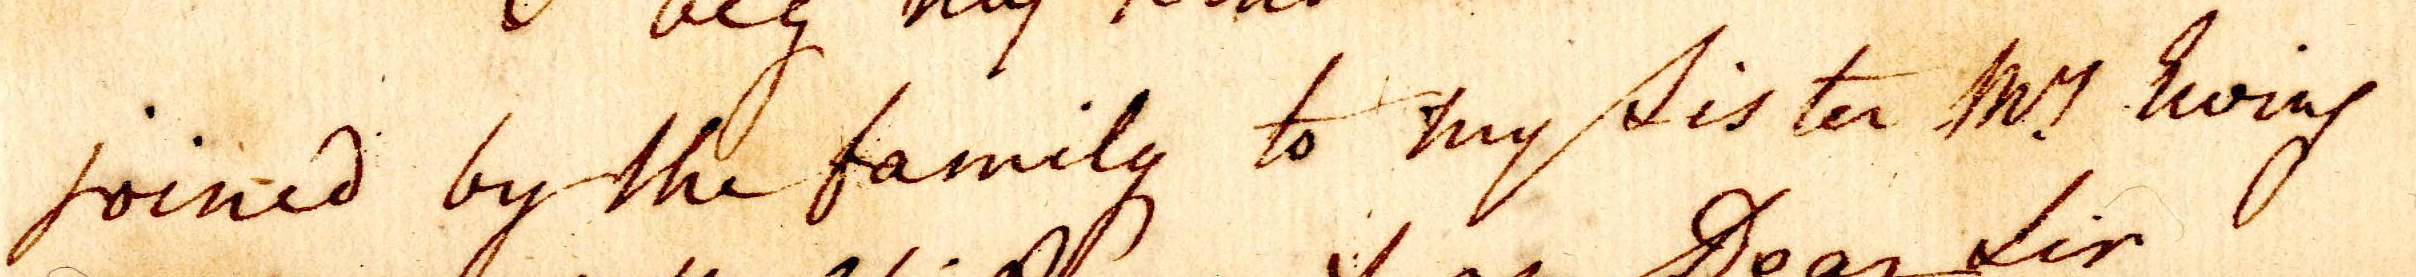joined by the family to my Sister Mr^s. Ewing
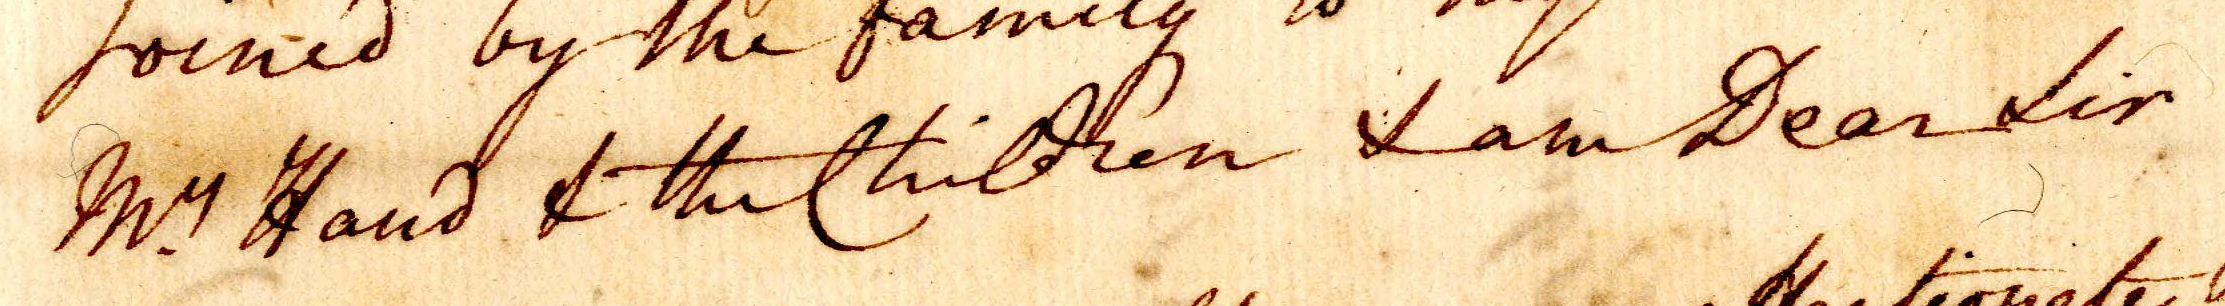M^rs. Hand & the Children & am Dear Sir
